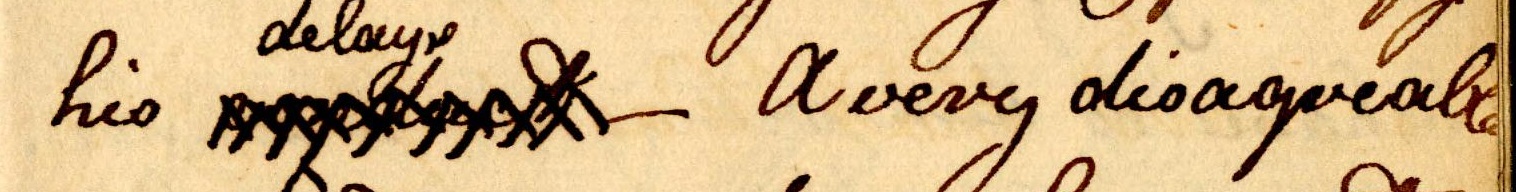his ^ [______]- A very disagreable
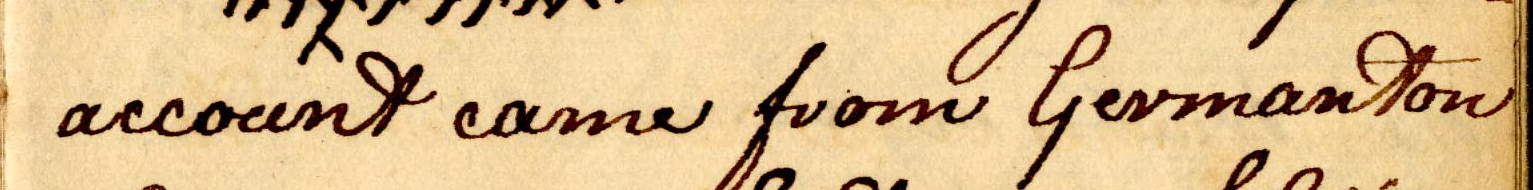account came from Germanton
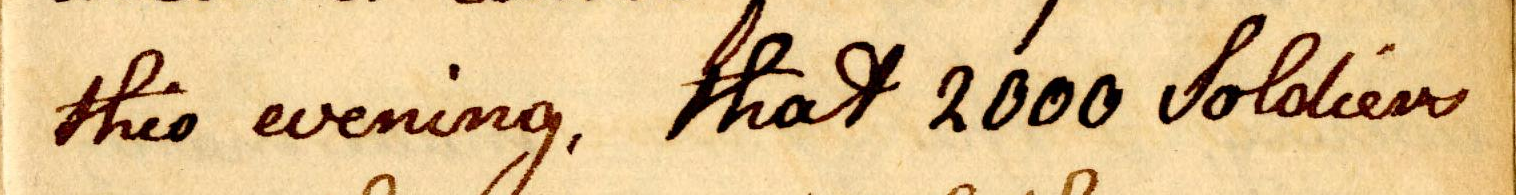this evening, that 2000 Soldiers
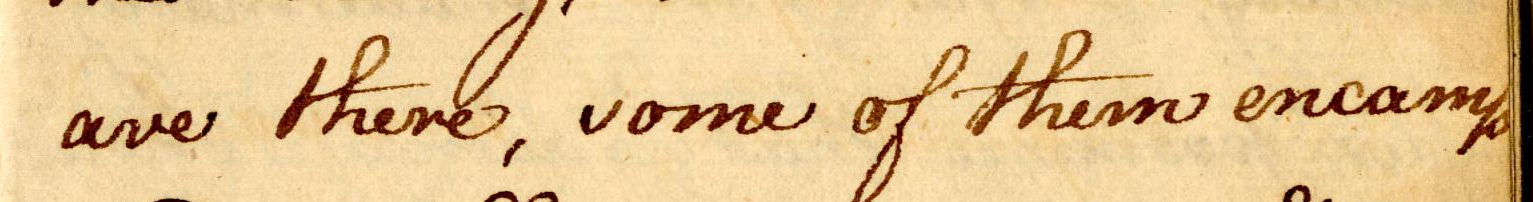are there, some of them encamp
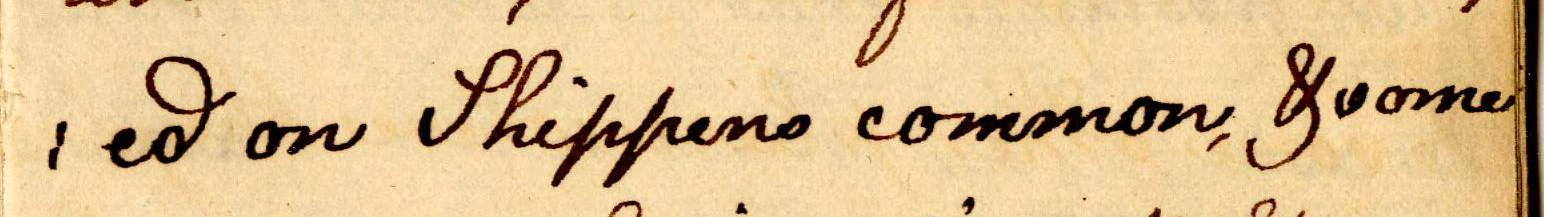-ed on Shippens common, & some
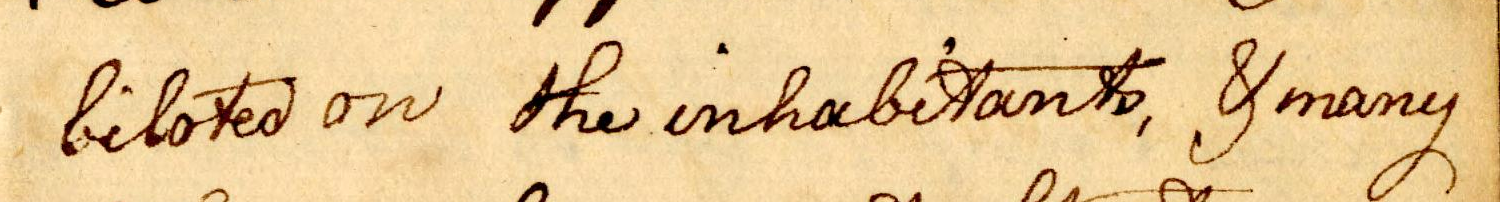biloted on the inhabitants, & many
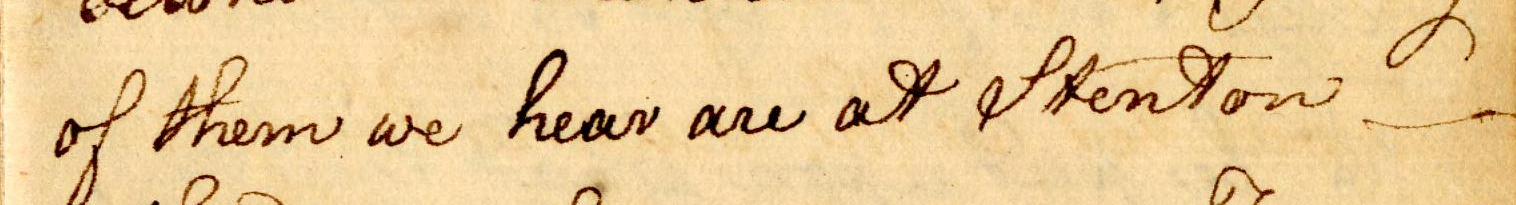of them we hear are at Stenton-
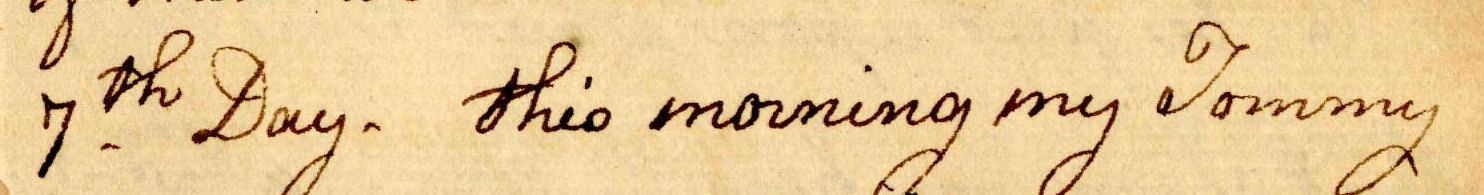7^th Day. this morning my Tommy
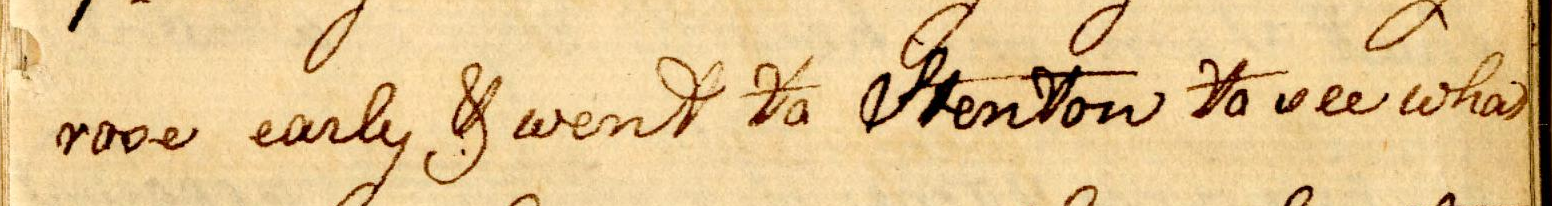rose early & went to Stenton to see what
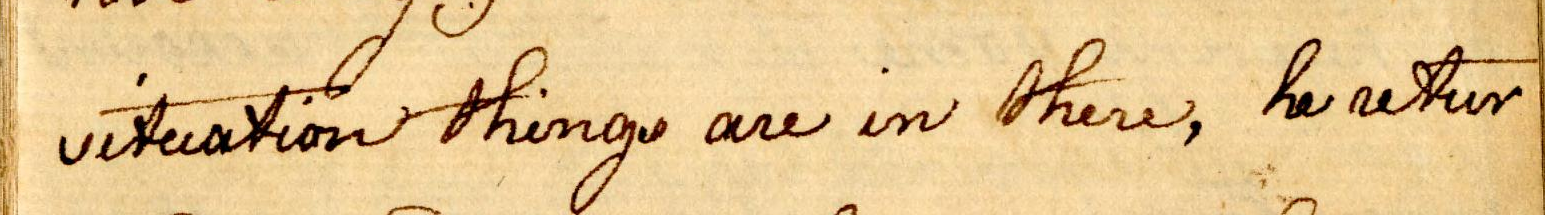situation things are in there, be retur
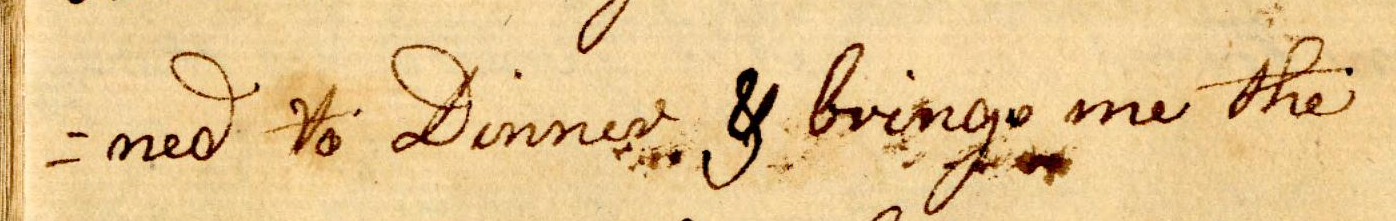-ned to Dinner & brings me the
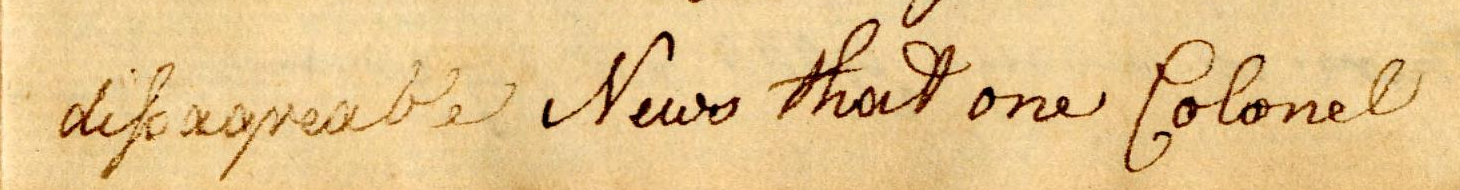dissagreable News that one Colonel
